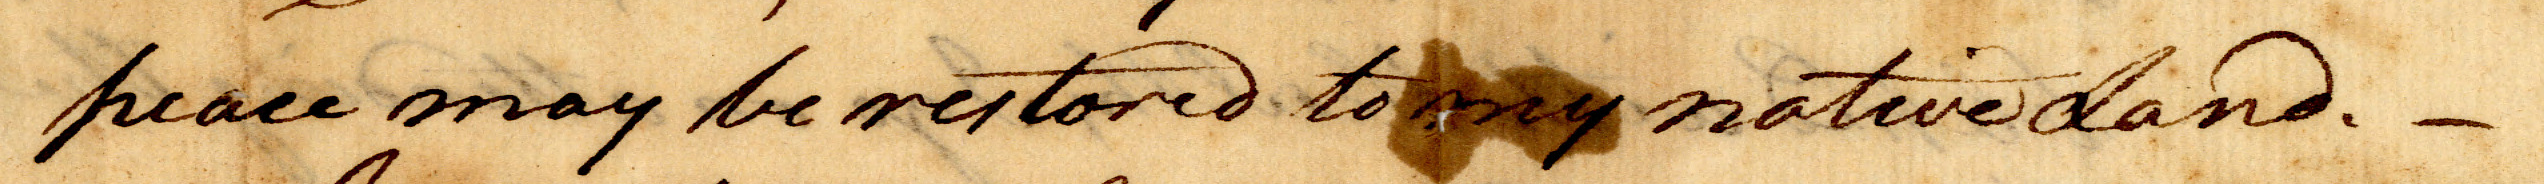peace may be restored to my native Land.-
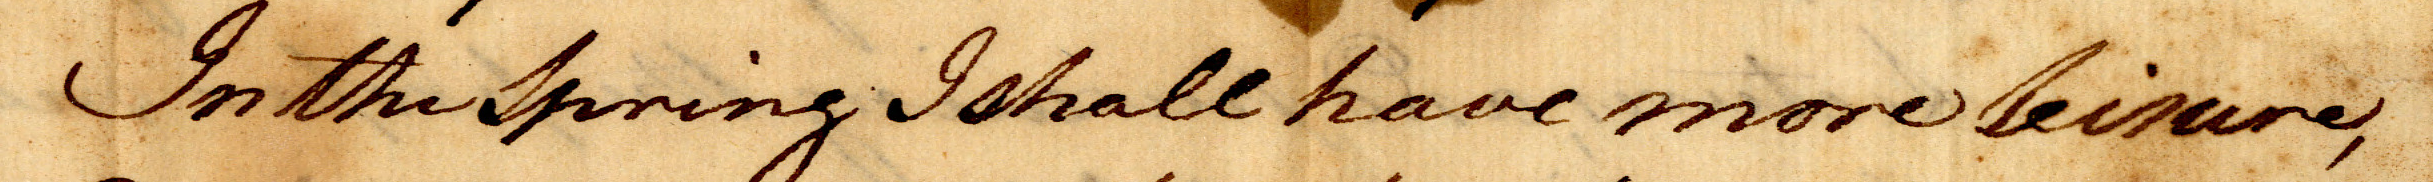In the spring I shall have more leisure,
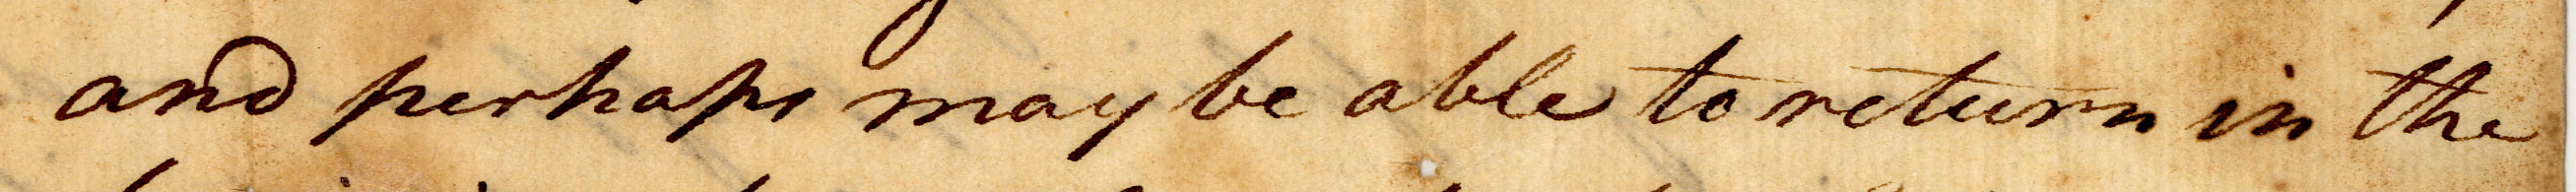and perhaps may be able to return in the
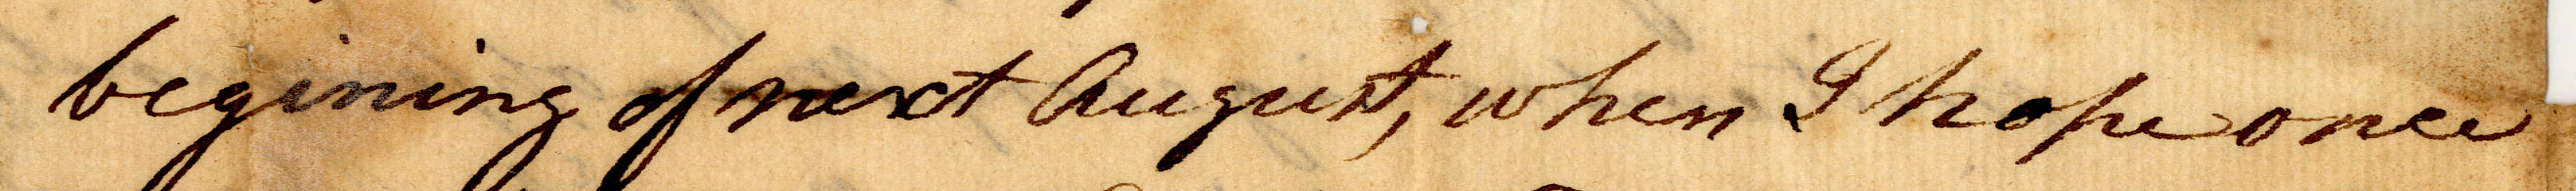beginning of next August, when I hope once
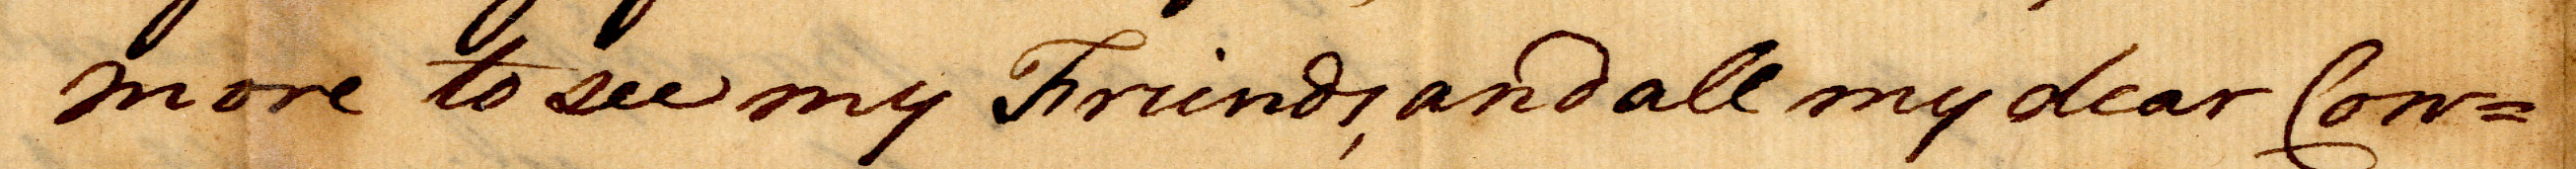more to see my Friends, and all my dear Con-
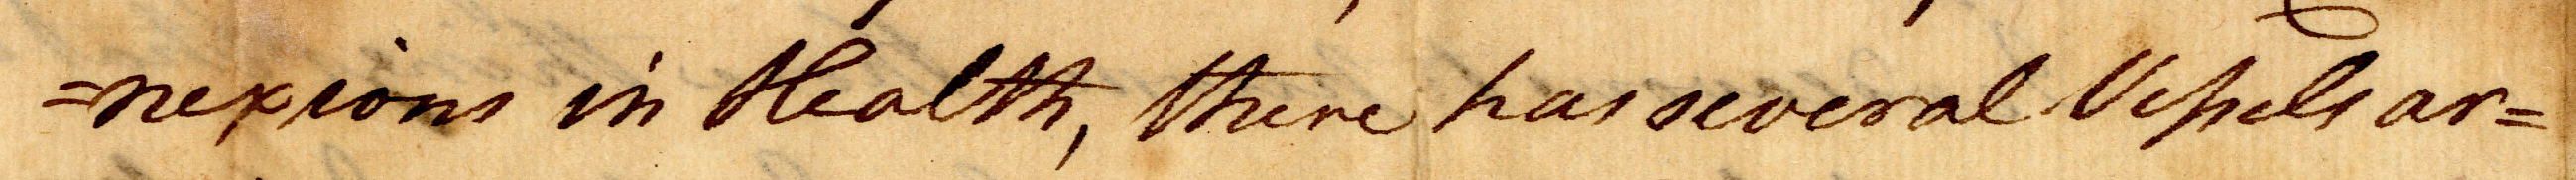-nexions in Health, there has several Vessels ar-
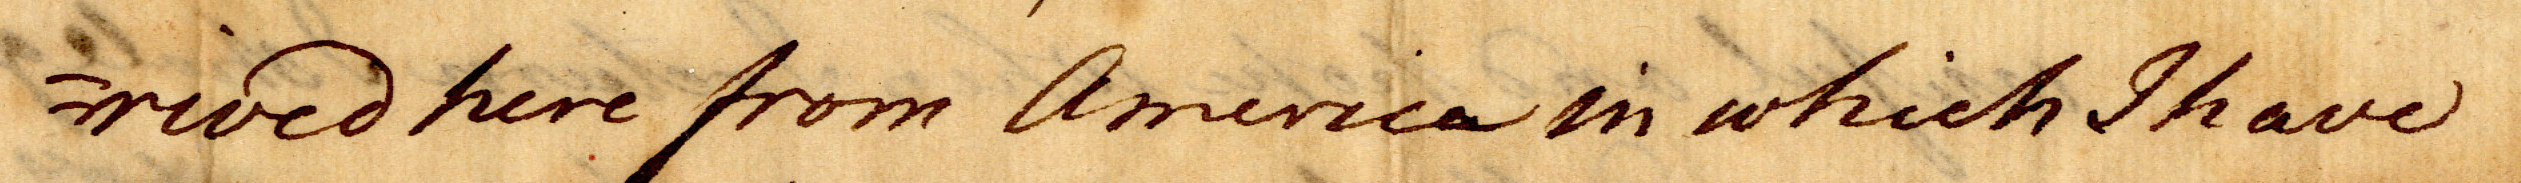-rived here from America in which
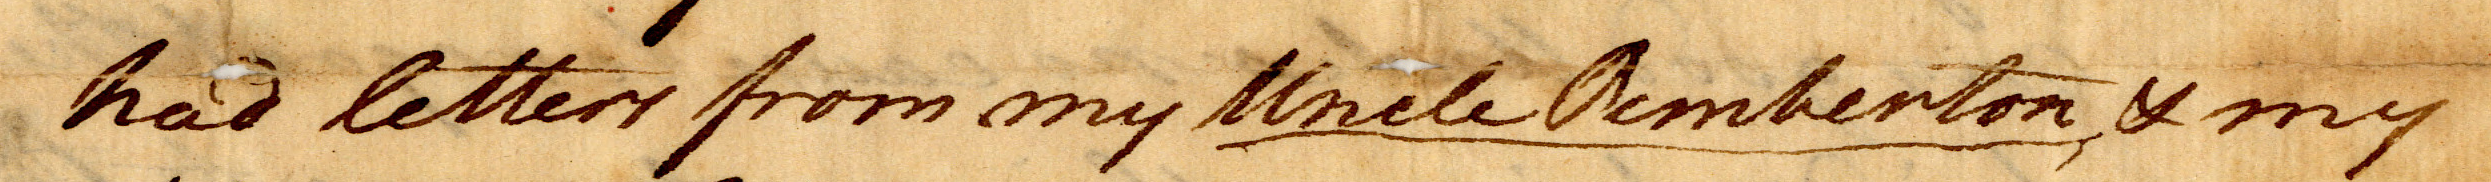had letters from my Uncle Pemberton, & my
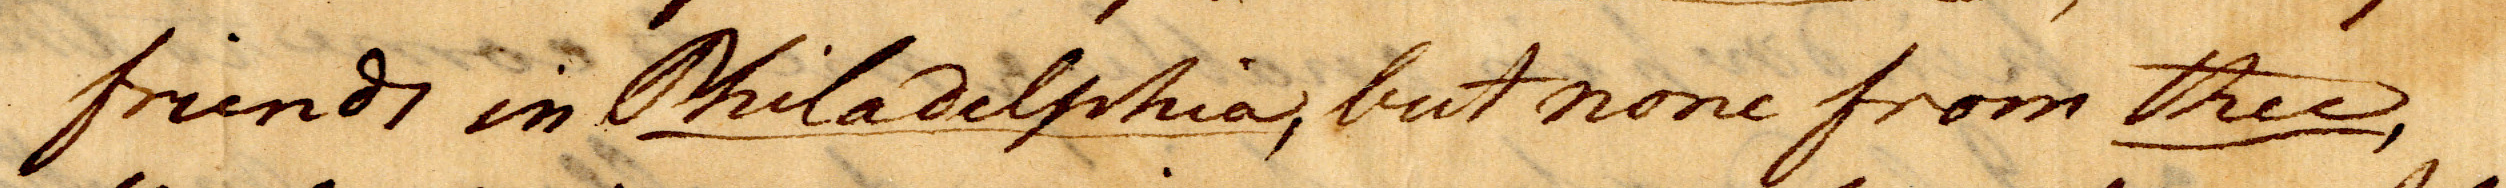friends in Philadelphia, but none from thee,
